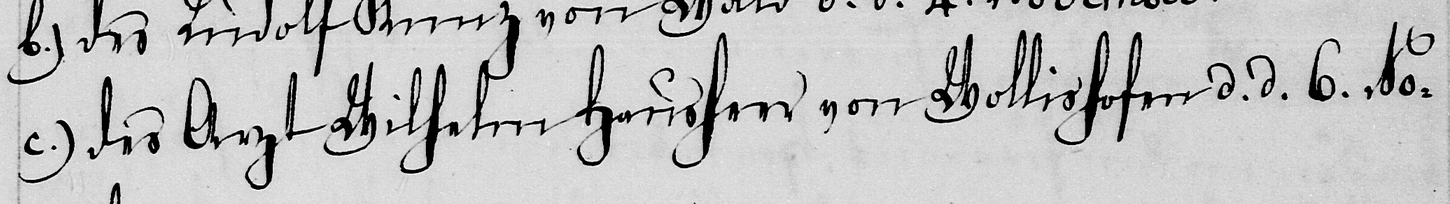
c.) des Arzt Wilhelm Hausheer von Wollishofen d. d. 6.
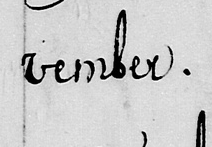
November.
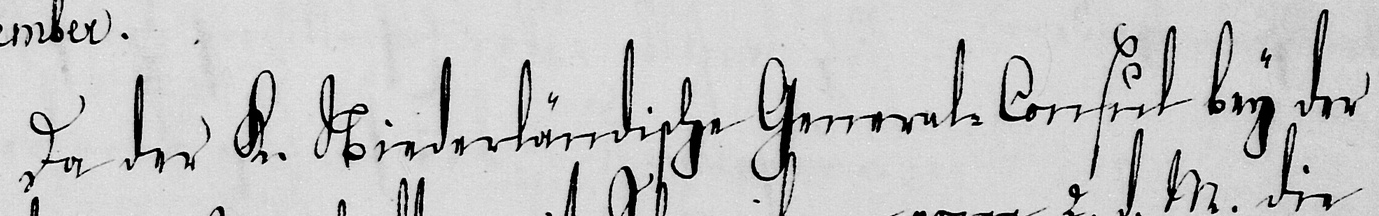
Da der K. Niederländische General-Consul bey der
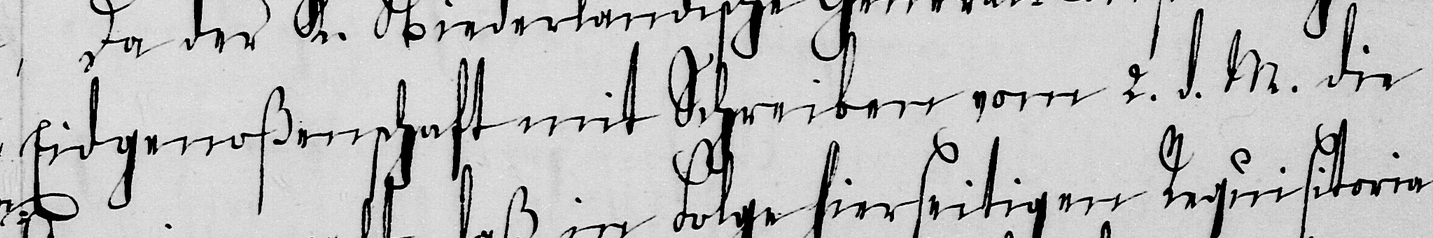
Eidgenoßenschaft mit Schreiben vom 2. d. M. die
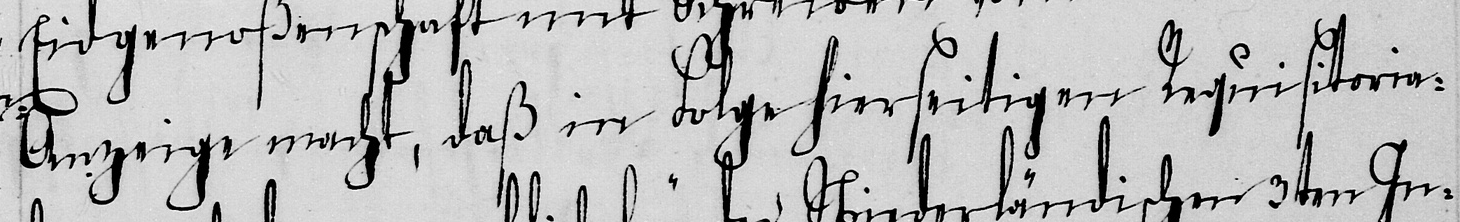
Anzeige macht, daß in Folge hierseitigen Requisitoria¬
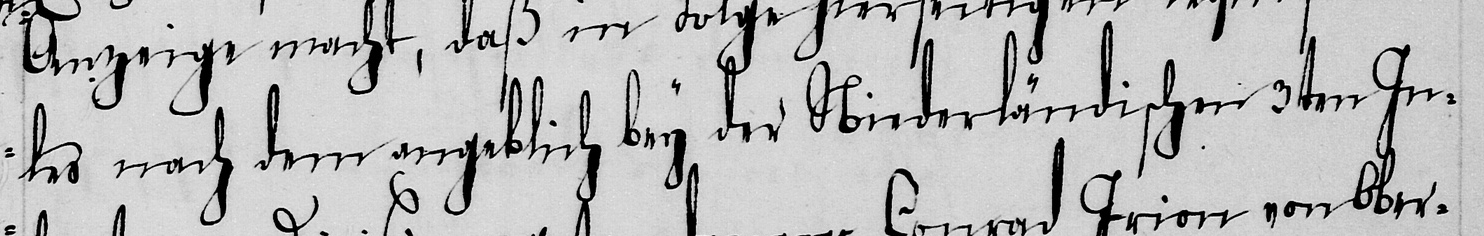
les nach dem angeblich bey der Niederländischen 3ten In¬
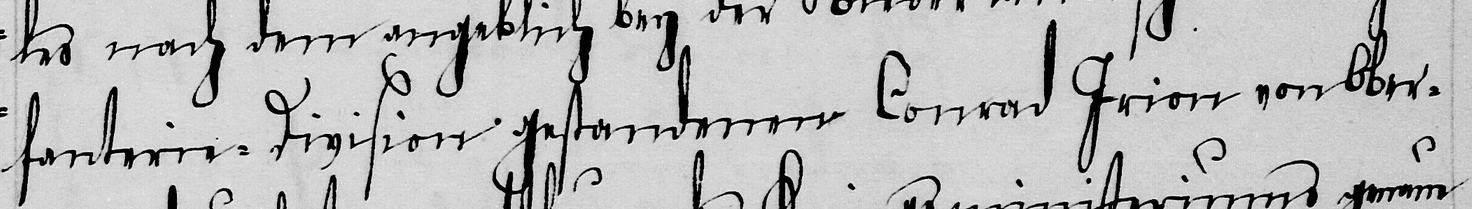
fanterie-Division gestandenen Conrad Irion von Ober¬
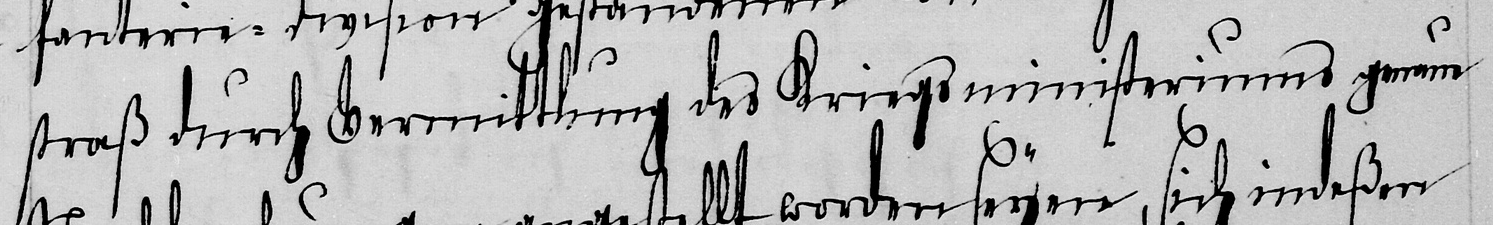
straß durch Vermittlung des Kriegsministeriums genaue
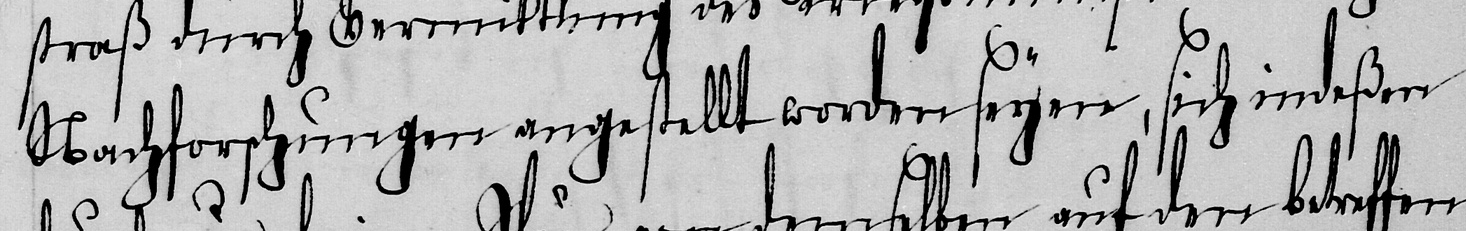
Nachforschungen angestellt worden seyen, sich indeßen
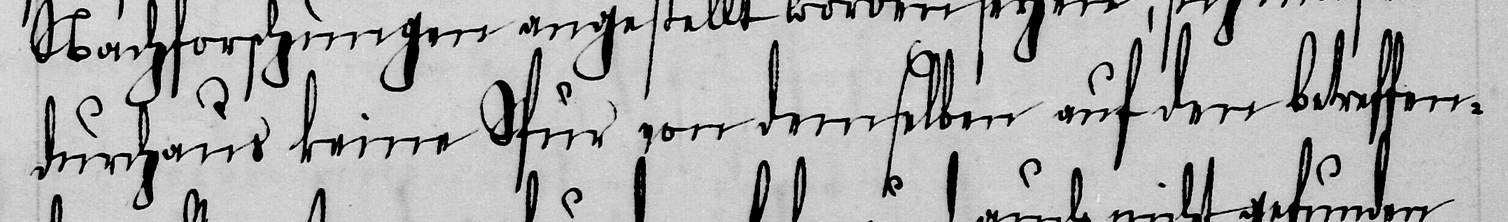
durchaus keine Spur von demselben auf den betre¬
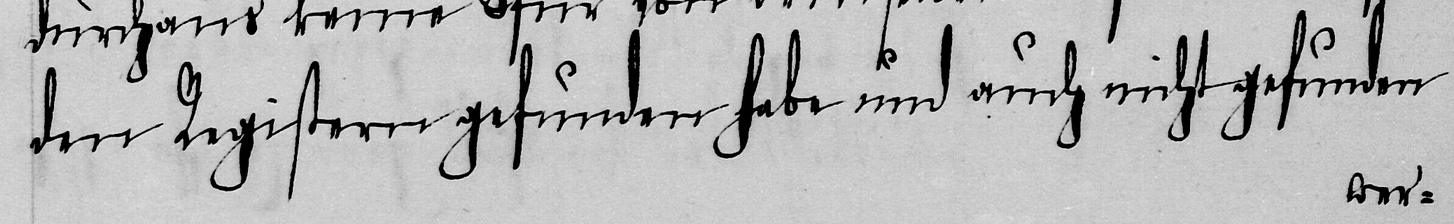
nden Registern gefunden habe und auch nicht gefunden
